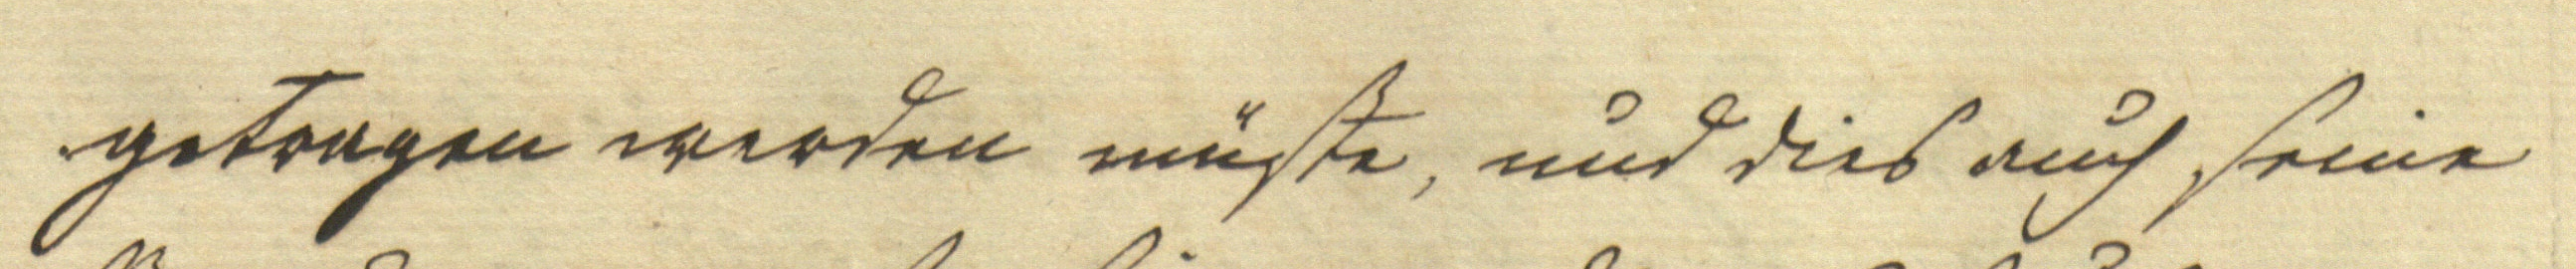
getragen werden müßte, und dies auch seine
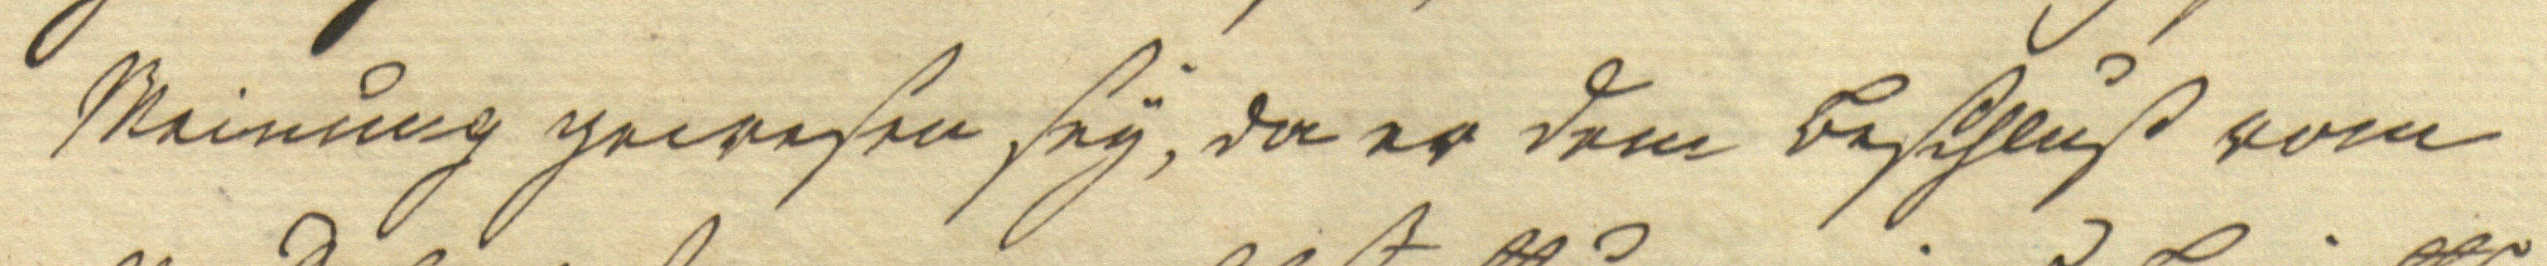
Meinung gewesen seÿ, da er dem Beschluß vom
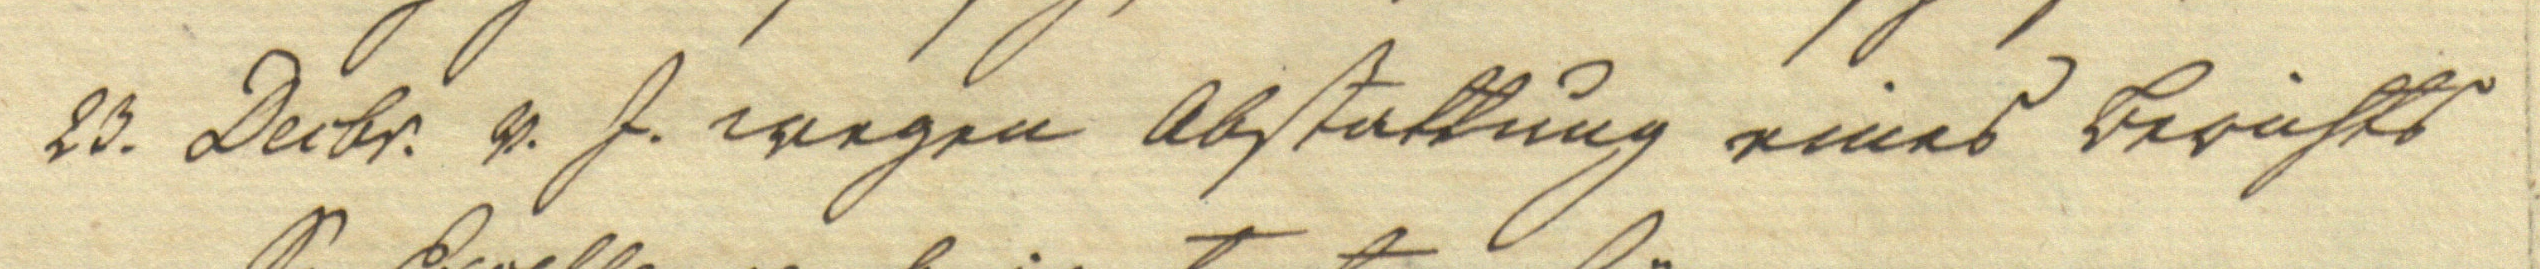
23. Decbr. v. J. wegen Abstattung eines Berichts
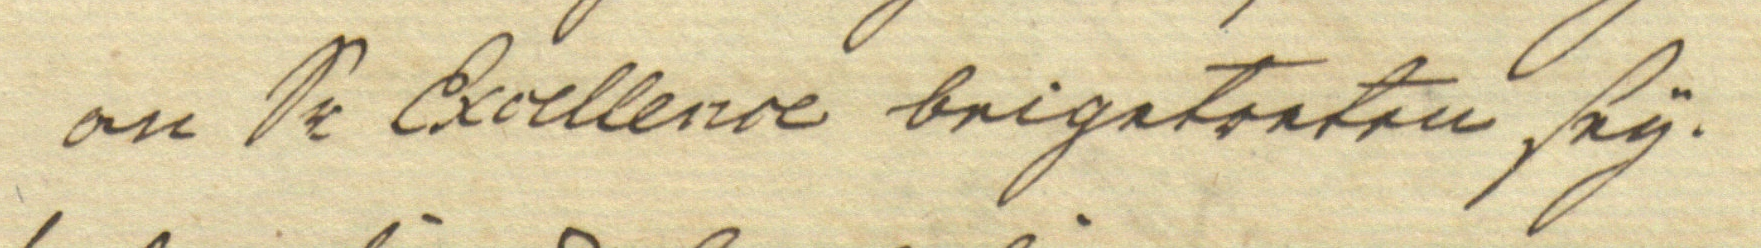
an Sr Excellence beigetreten seÿ.
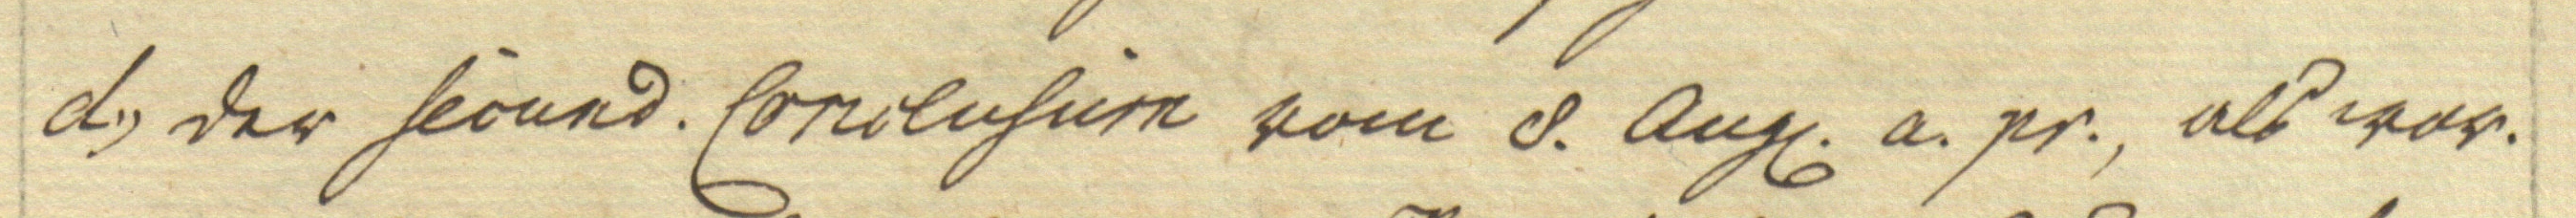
d., der secund. Conclusum vom 8. Aug. a. pr., als wor¬
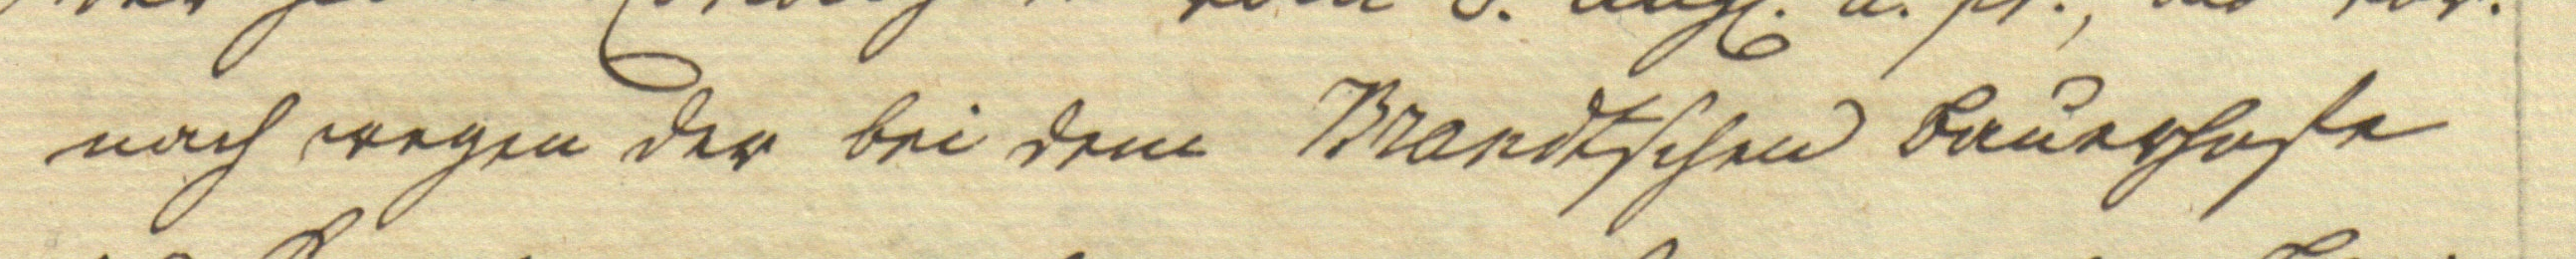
nach wegen der bei dem Brandtschen Bauerhofe
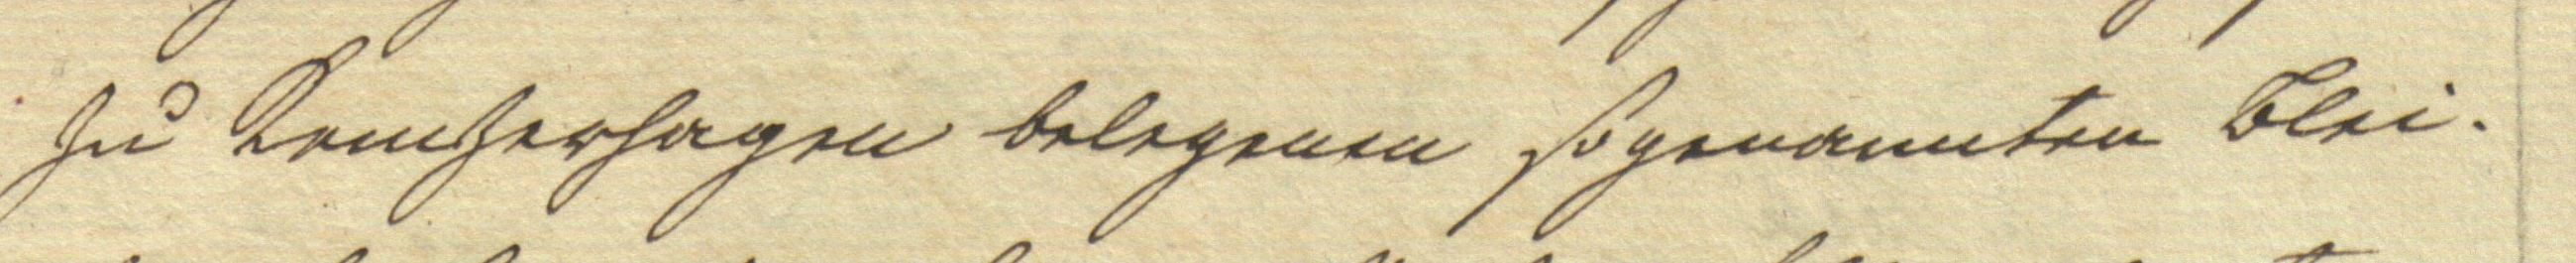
zu Kemzerhagen belegenen sogenannten Blei¬
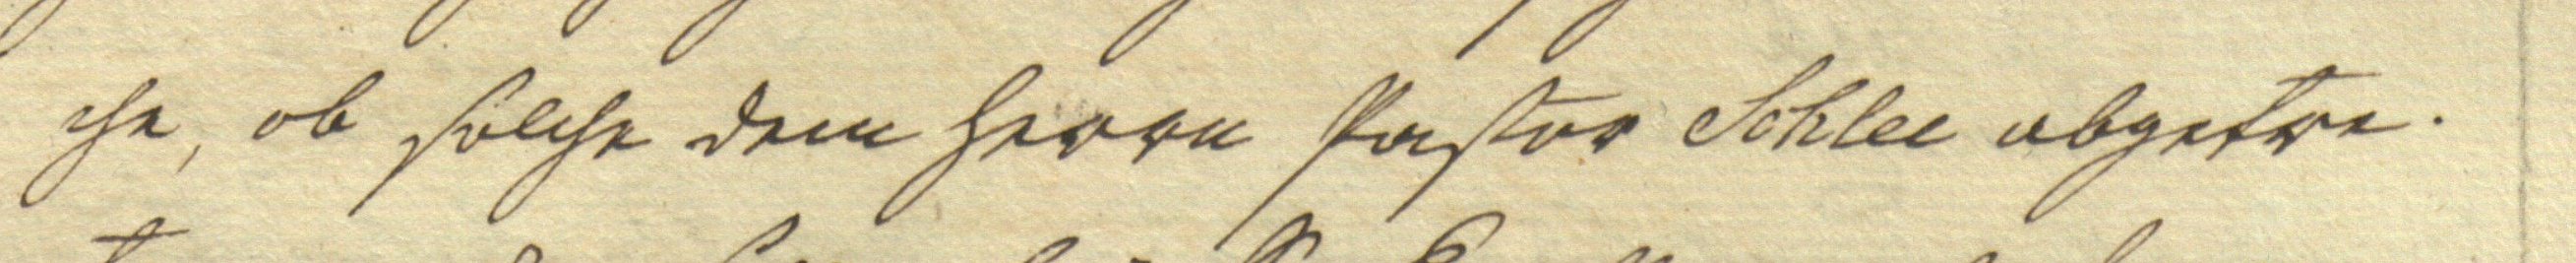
che, ob solche dem Herrn Pastor Schlee abgetre¬
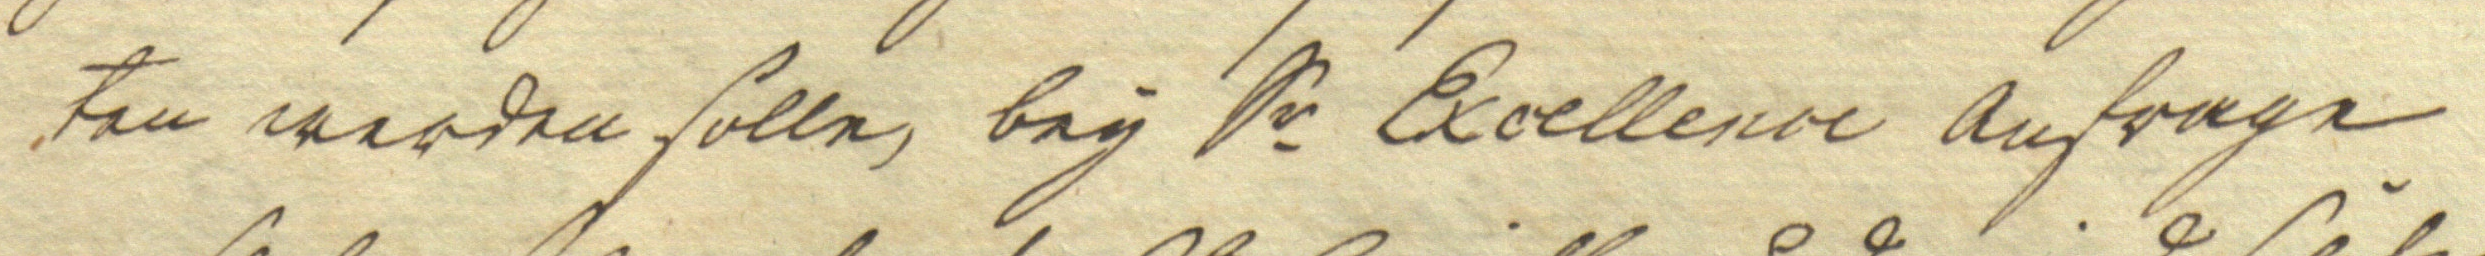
ten werden solle, beÿ Sr Excellence Anfrage
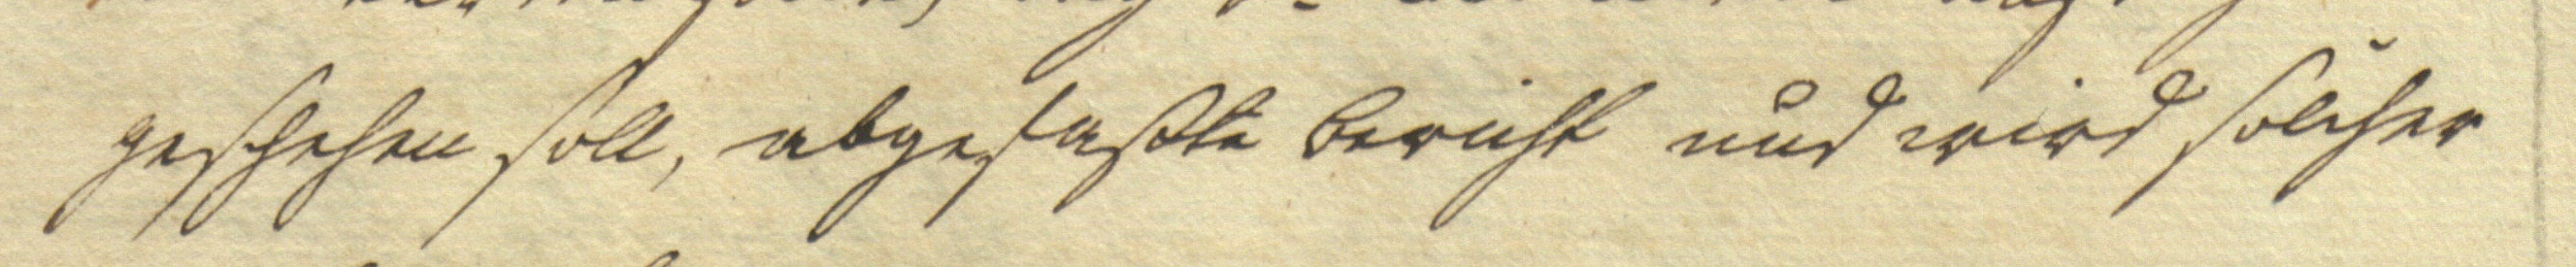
geschehen soll, abgefaßte Bericht und wird solcher
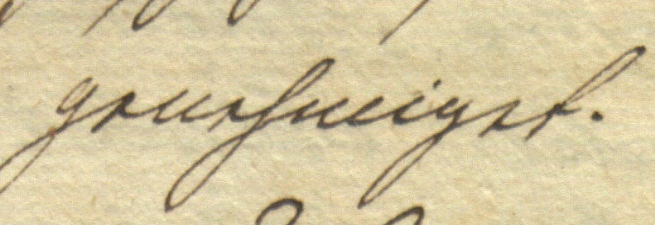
genehmiget.
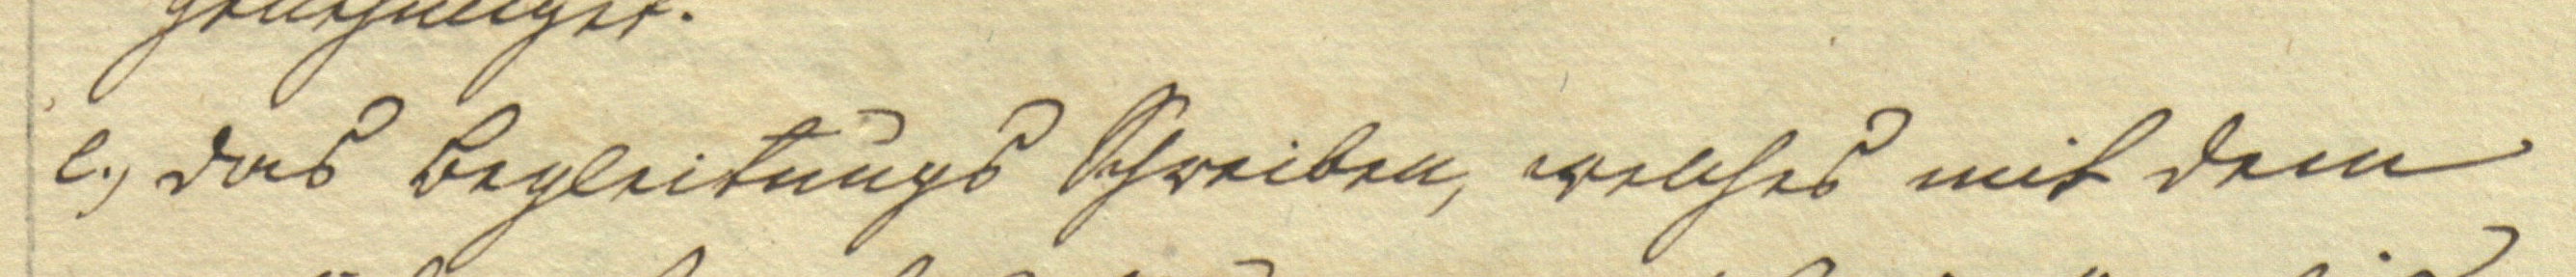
e., das Begleitungs Schreiben, welches mit dem
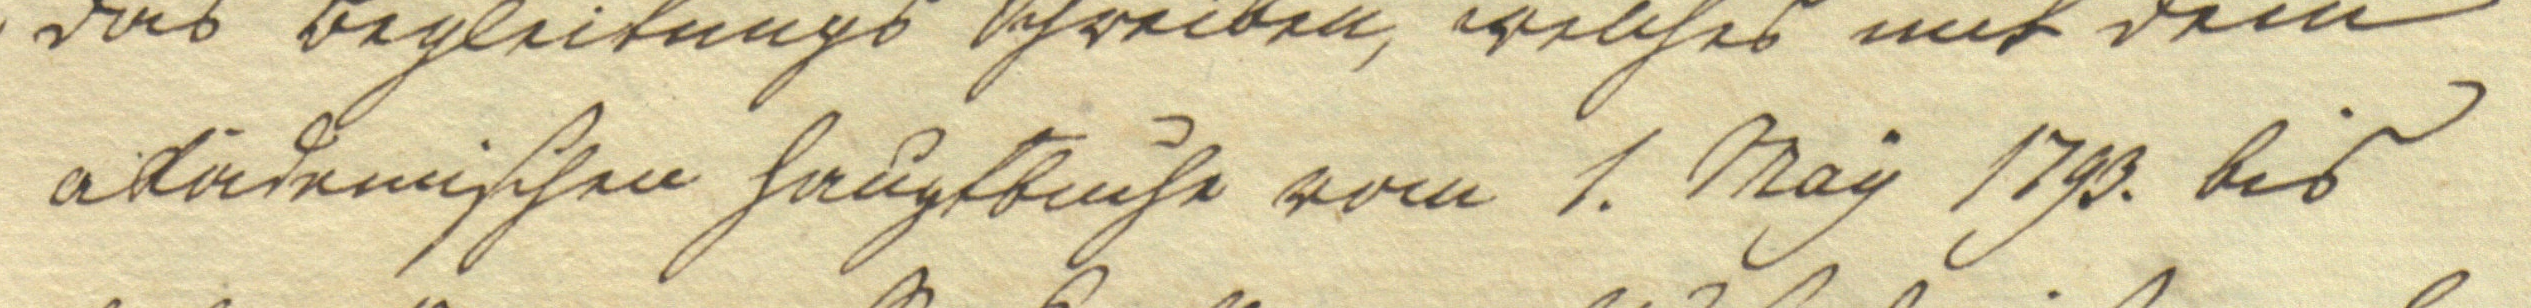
akademischen Hauptbuche vom 1. Maÿ 1793. bis
